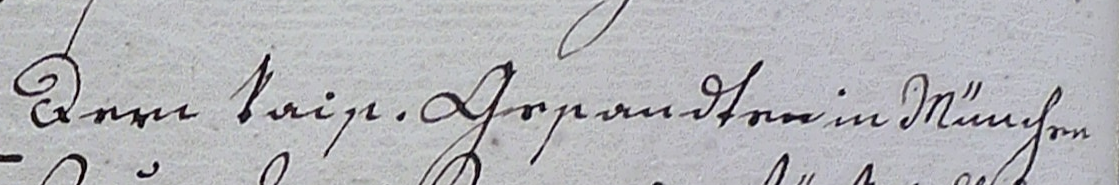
Dem kais. Gesandten in München
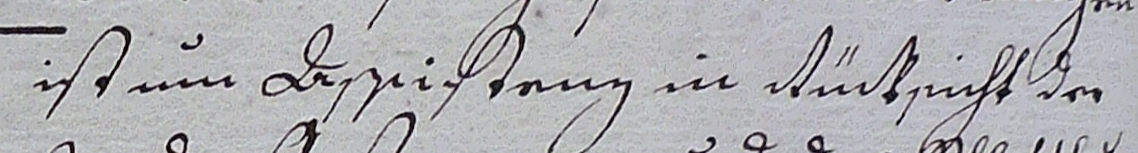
ist um Assistenz in Rücksicht der
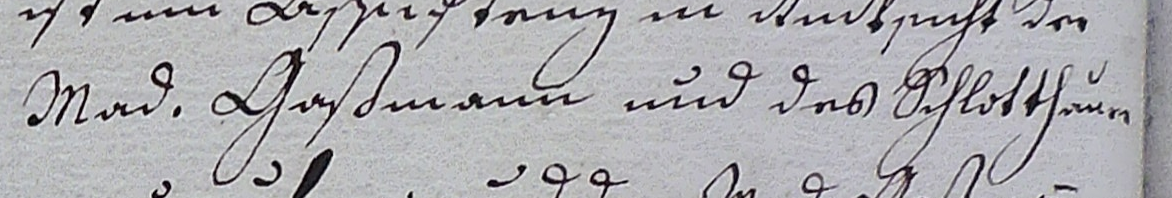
Mad. Gaßmann und des Schlotthauer
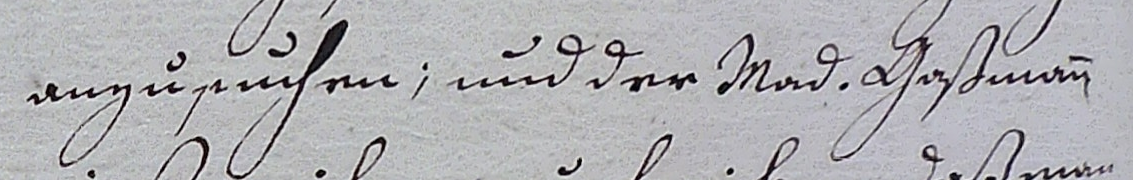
anzusuchen; und der Mad. Gaßman̅
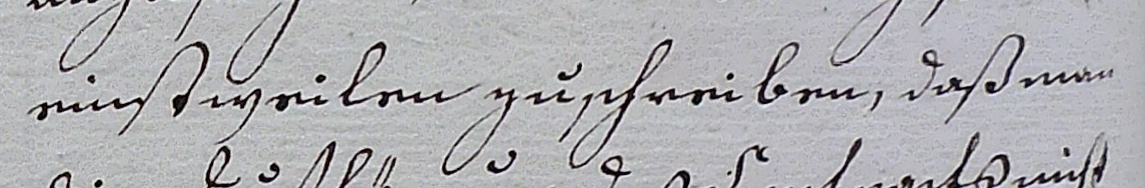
einstweilen zuschreiben, daß man
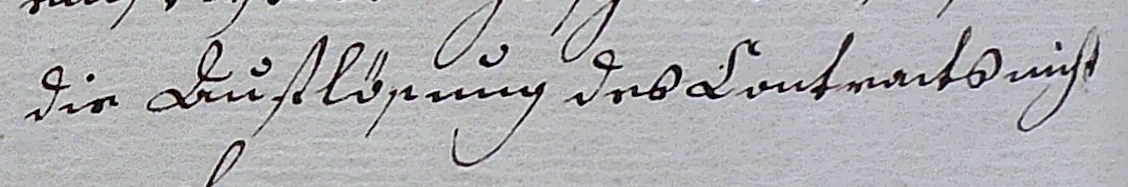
die Auflösung des Contracts nicht
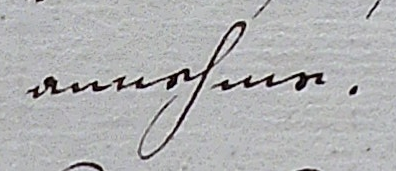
annehmne,.
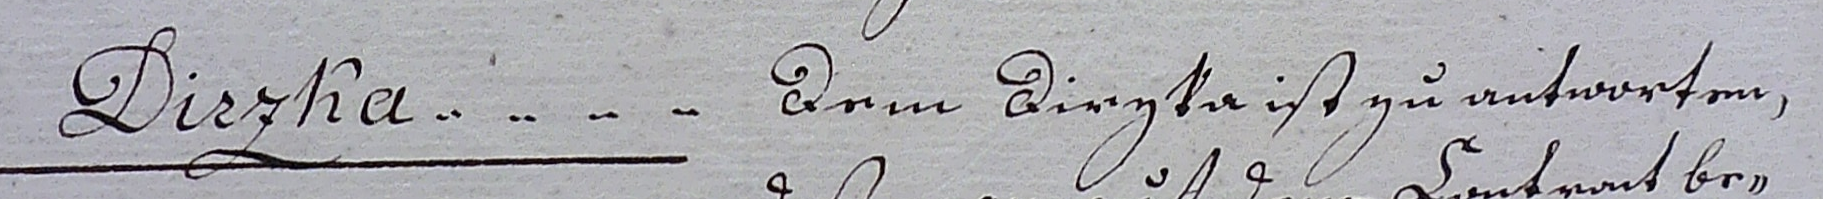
Dirzka .. .. .. .. Dem Dirzka ist zu antworten,
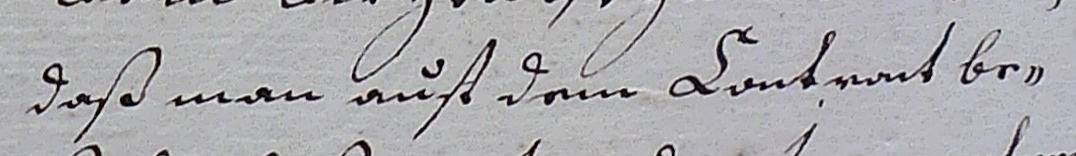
daß man auf dem Contract be¬
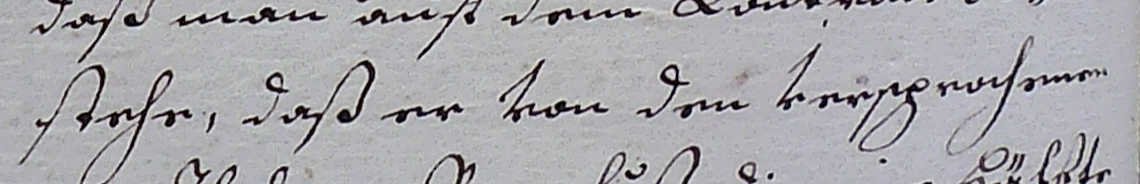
stehe, daß er von den versprochenen
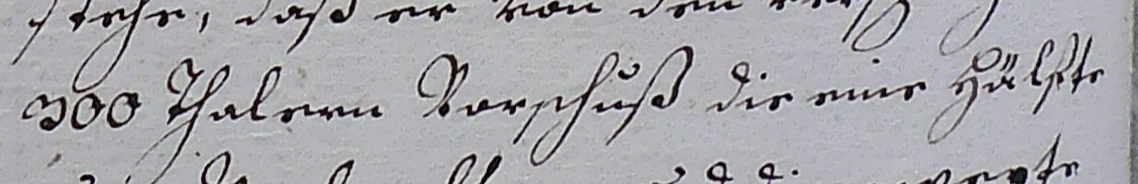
300 Thalern Vorschuß die eine Hälfte
